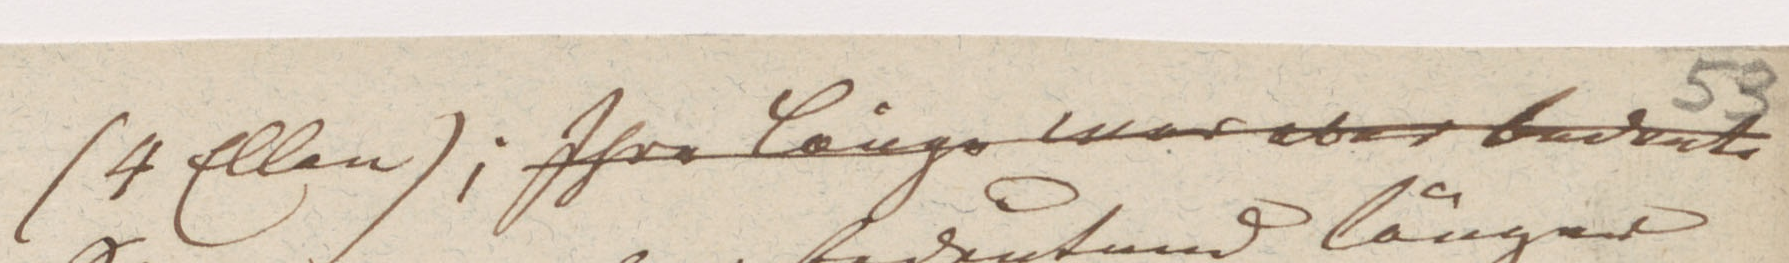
(4 Ellen); Ihre Länge war aber bedeut
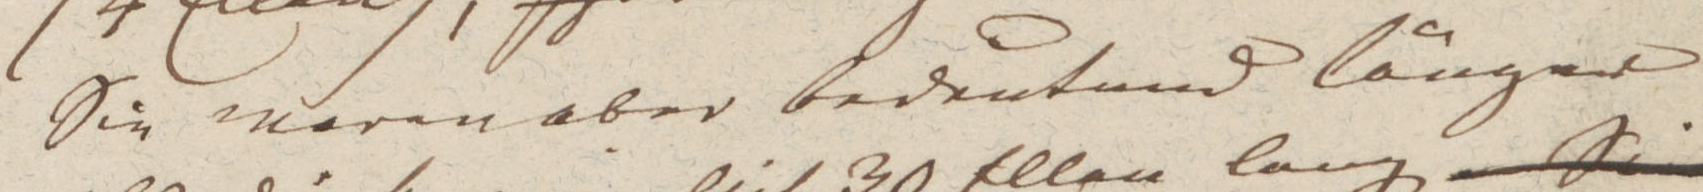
Sie waren aber bedeutend länger
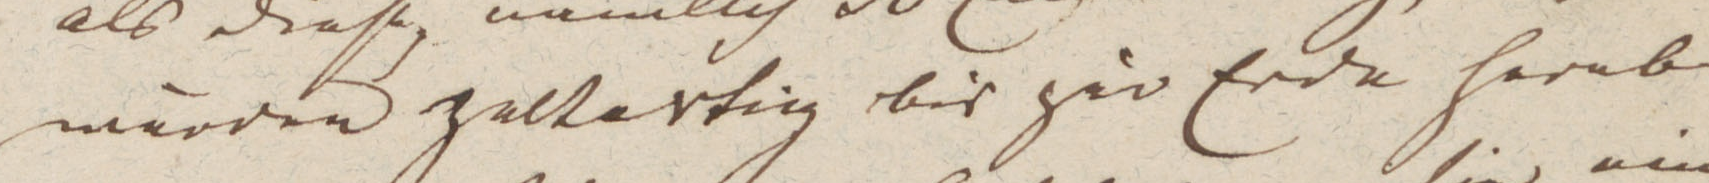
wurden zeltartig bis zur Erde herab-
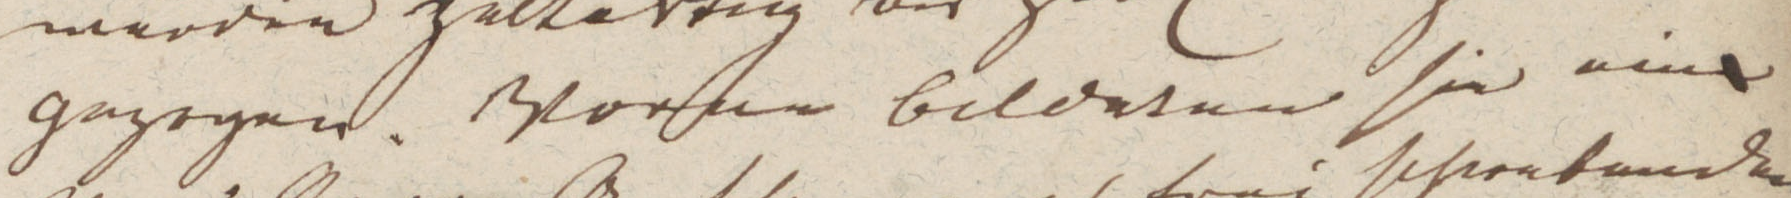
gezogen. Vorne bildeten sie eine
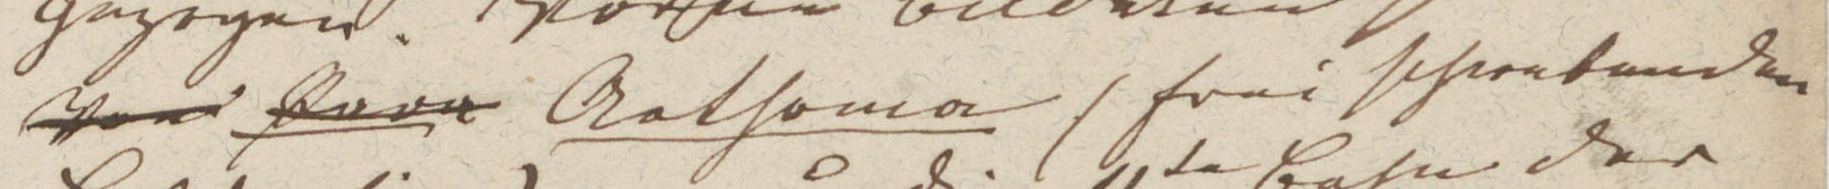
Von Para Aethoma (frei schwebenden
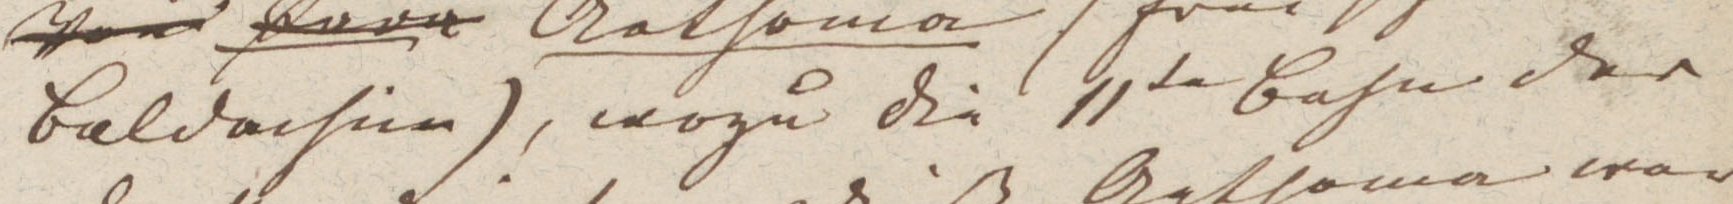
Baldachin), wozu die 11te Bahn der
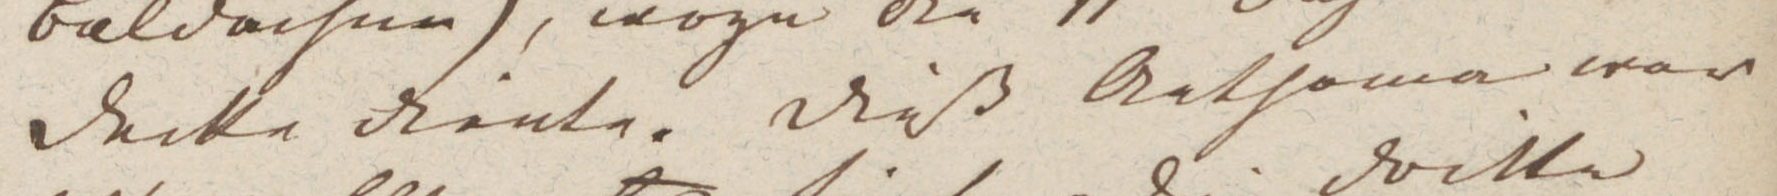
Decke diente. Diess Aethoma war
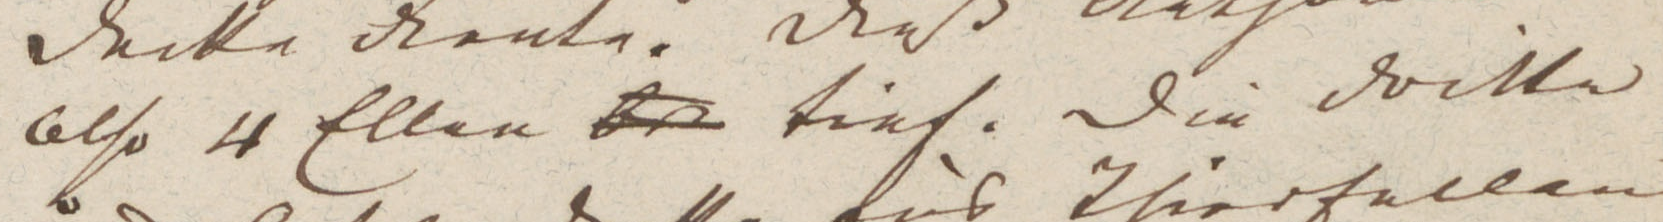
also 4 Ellen br tief. Die dritte
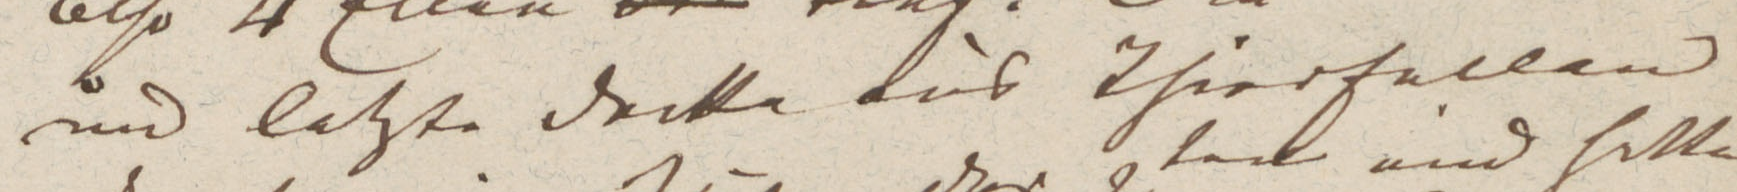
und letzte Decke aus Thierfellen
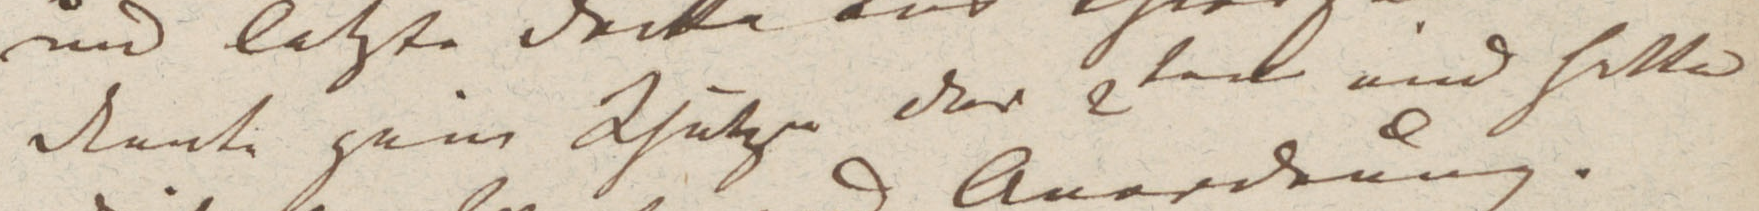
diente zum Schutze der 2ten und hatte
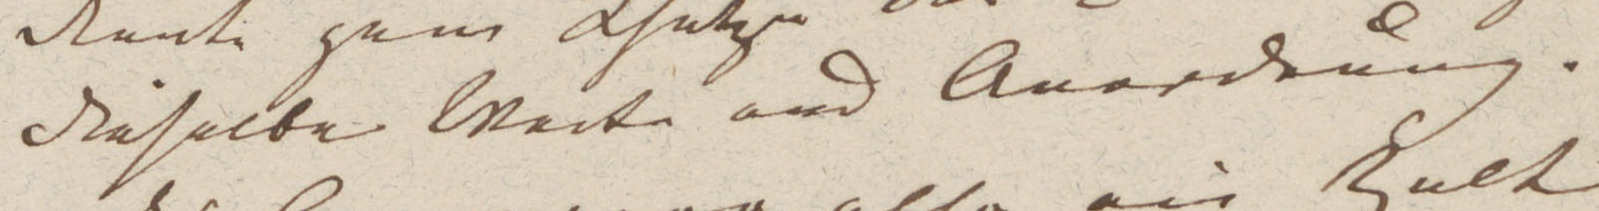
dieselbe Weite und Anordnung.
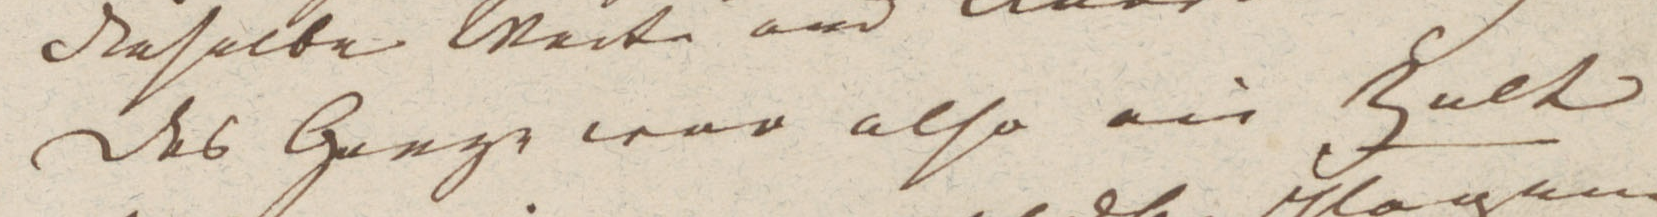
Das Ganze war also ein Zelt
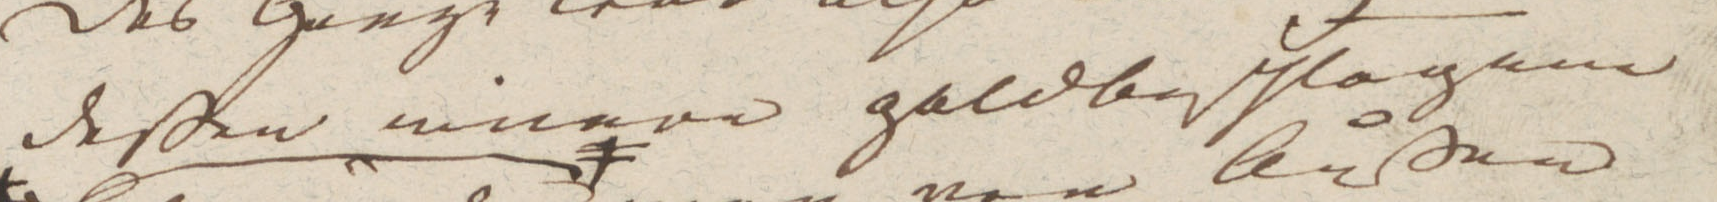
dessen innere goldbeschlagene
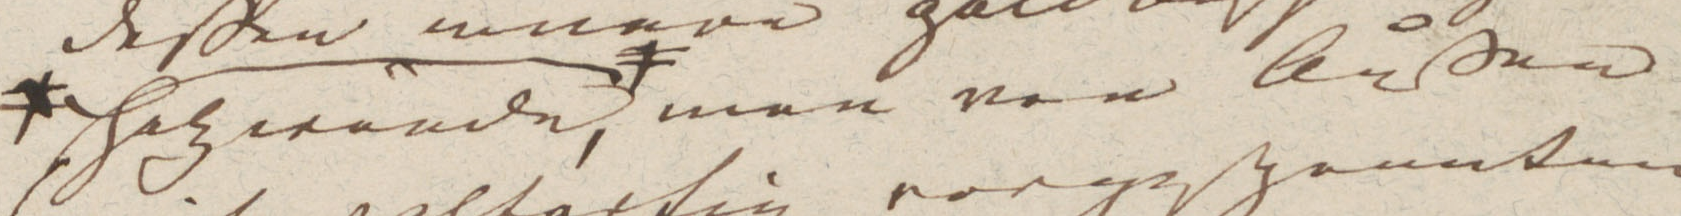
Holzwände, %% man von Aussen
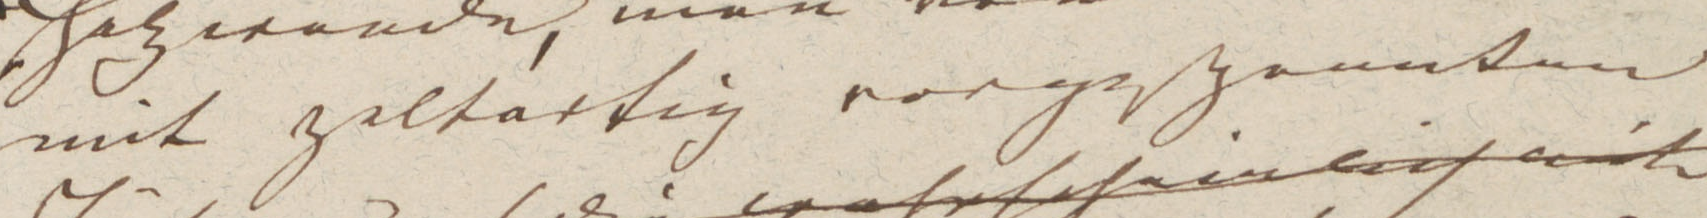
mit zeltartig vrogespannten
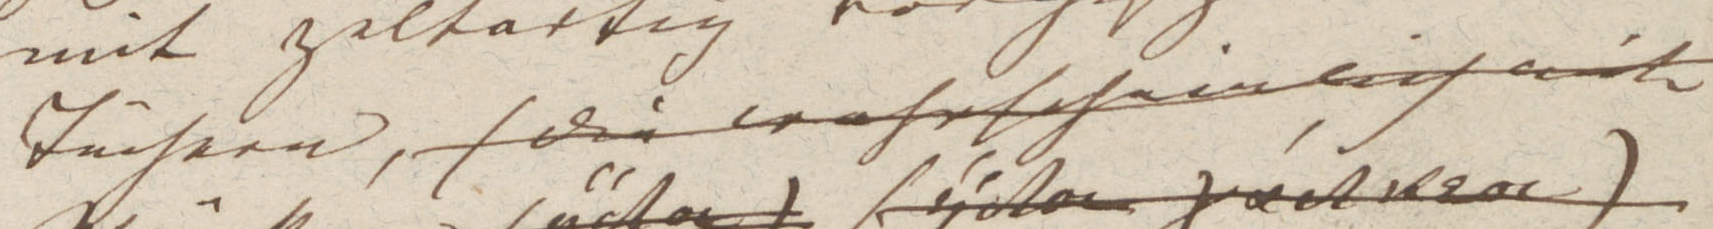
Tüchern, (die wahrscheinlich mit
